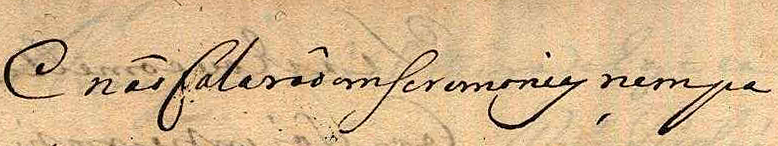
E naõ falaraõ em seremonias nem pa
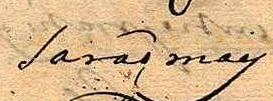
sarão mais
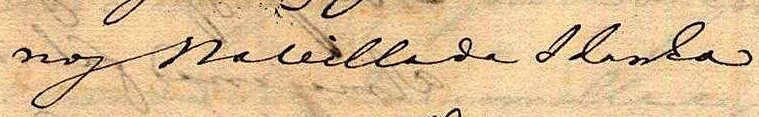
nos na uilla da Idanha
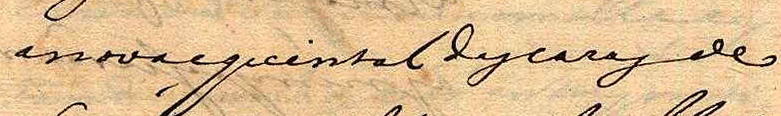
a nova, e quintal das cazas de
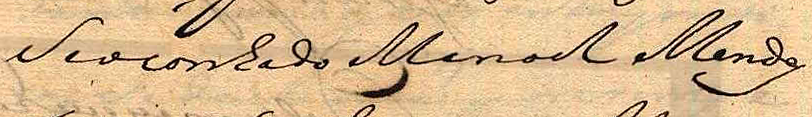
seo conhado Manoel Mendes
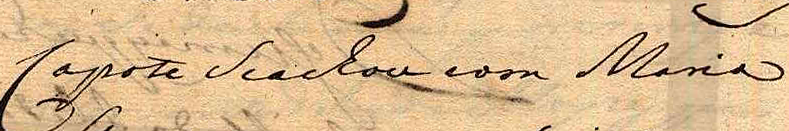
Capote Se achou com Maria
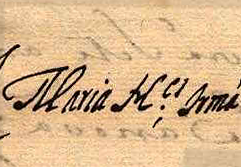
Maria H.es, Irmã
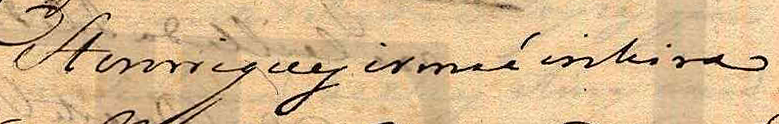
Henriques irmaã inteira
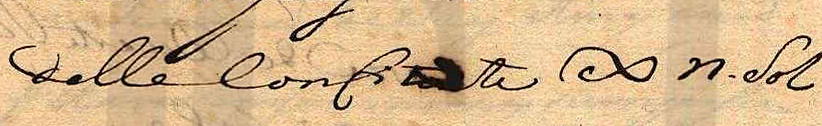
delle Confitente x n. sol
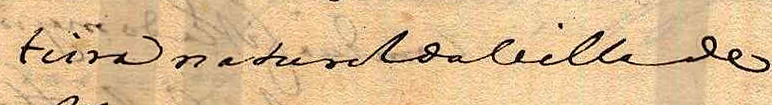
teira natural da villa de
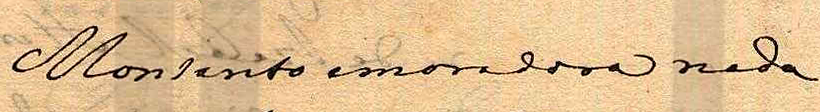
Monsanto e moradora na da
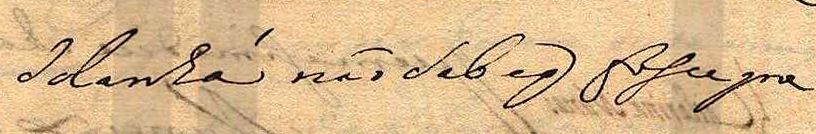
Idanha naõ sabe q̄ fosse pre
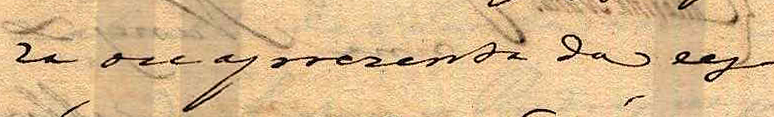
za ou aprezentada e es
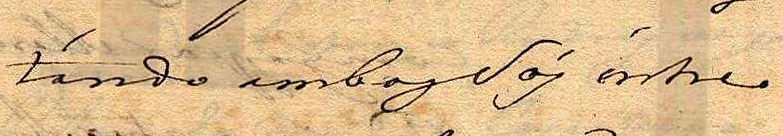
tando ambos Sós entre
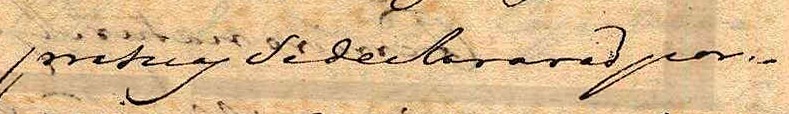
praticas se declararaõ por
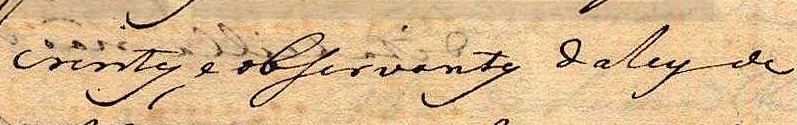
crentes, e observantes da ley de
